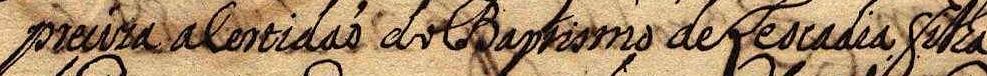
preciza a Certidaõ do Baptismo de Leocadia, filha
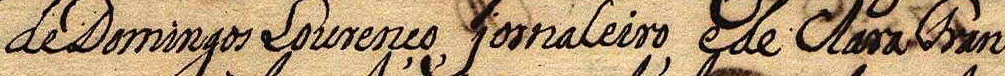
de Domingos Lourenço, jornaleiro, e de Clara Fran
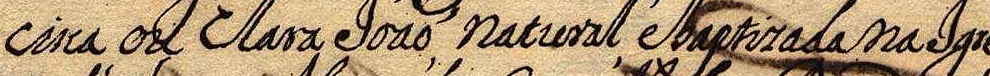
cisca, ou Clara Ioaõ, natural, e baptizada na Igre
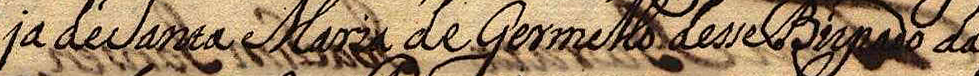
ja de Santa Maria de Germello desse Bispado da
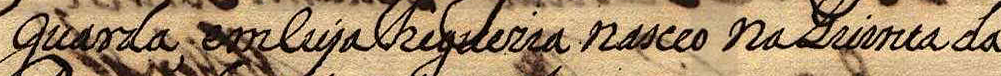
Guarda, em Cuja Freguezia nasceo na Quinta da
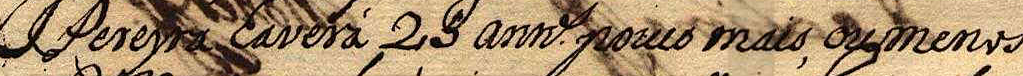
Pereyra haverá 25 ann.s pouco mais, ou menos:
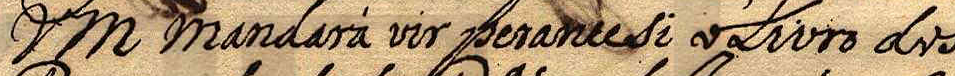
V M mandará vir perante si o Livro dos
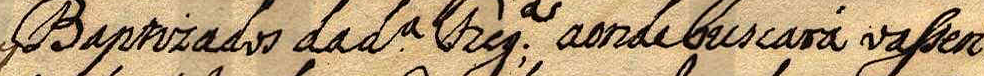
Baptizados da d.a Freg.a; aonde buscará o assen
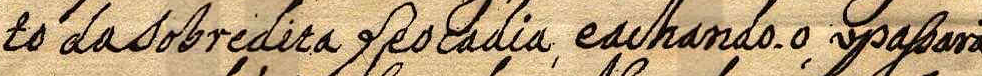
to da Sobredita Leocadia, e achando-o, o passará
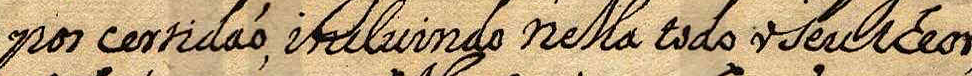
por certidaõ, incluindo nella todo o seu theor,
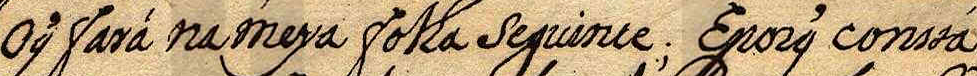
o q̄ fará na meya folha seguinte; E porq̄ consta
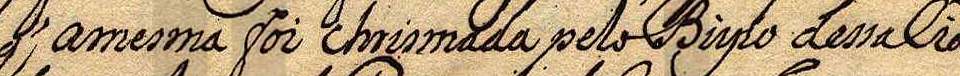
q̄ a mesma foi chrismada pelo Bispo dessa Cida
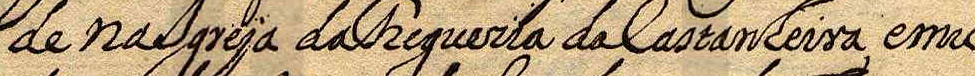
de na Igreja da Freguezia da Castanheira, e mu
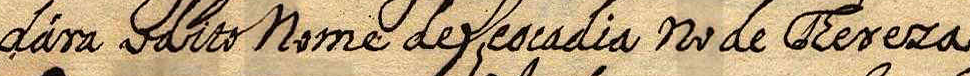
dára o dito Nome de Leocadia no de Thereza
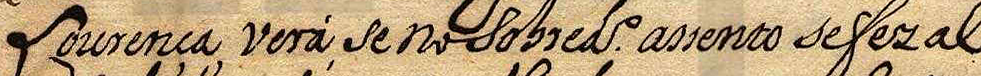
Lourença, verá, se no Sobred.o assento se fez al
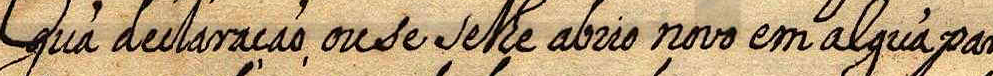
guā declaraçaõ, ou se se lhe abrio novo em alguā par
